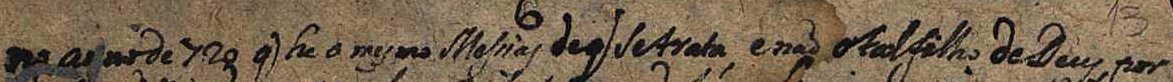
no a_no de 720 q̄ he o mesmo Messias de q̄ se trata, e naõ o tal filho de Deus, por
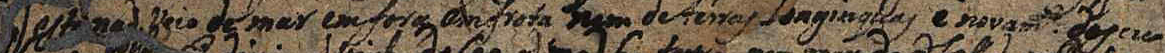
q̄ est_ naõ veio de mar em fora em frota nem de terras Longinquas e novam.te descu
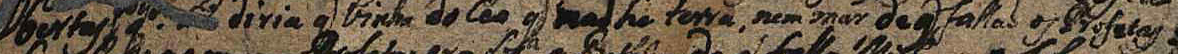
bertas q̄. _ diria q̄ vinha do Ceo q̄ naõ he terra, nem mar de q̄ fallaõ os Profetas
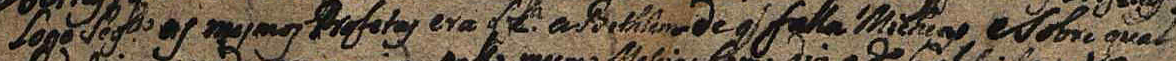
Logo seg.do os mesmos Profetas era Lx.a a Bethlem de q̄ falla Micheo, e Sobre qual
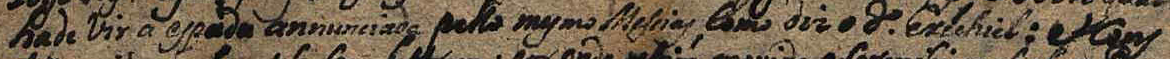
ha de vir a espada annunciada pello mesmo Messias, Como diz o d.o Exechiel; e Cons
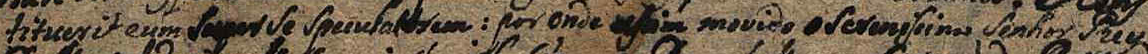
tituerit cum super se speculatorem: por onde assim movido o Serenissimo Senhor Rey
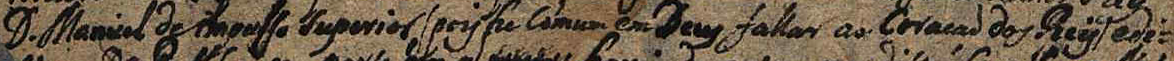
D. Manuel de impulso superior /pois he Com̄um em Deus fallar ao Coraçaõ dos Reis/ edi
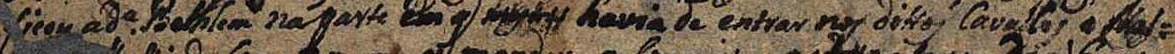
ficou a d.a Bethlem na parte em q̄ estes havia de entrar nos dittos Cavallos e foraõ
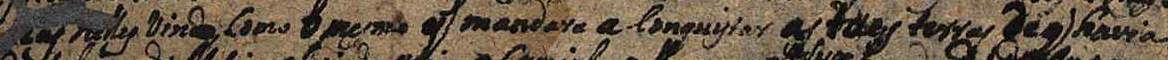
_as neles vindo Como o mesmo q̄ mandara a Conquistar as taes terras de q̄ havia
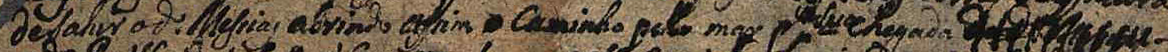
de sahir o d.o Messias abrindo assim o Caminho pelo mar p.a sua chegada
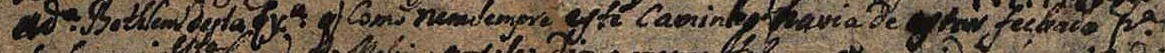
a d.a Bethlem desta Lx.a q̄ Como nem sempre este Caminho o havia de estar fechado p.a
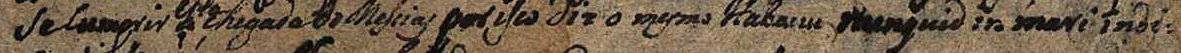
se cumprir a çhegada do Messias por isso diz o mesmo Habacuc nunquid in mari indi
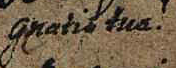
gnatio tua!
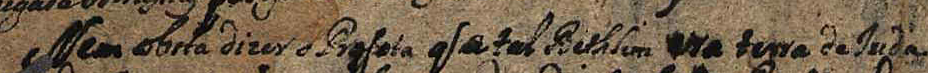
Nem obsta dizer o Profeta q̄ a tal Bethlem era terra de Iuda
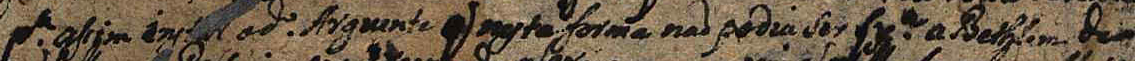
p.a assim instar o d.o Arguente q̄ nesta forma naõ podia ser Lx.a a Bethlem de
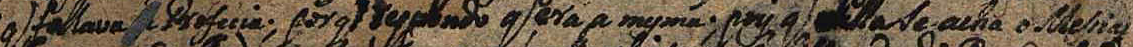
q̄ falava a Profecia; porq̄ respondo q̄ era a mesma; pois q̄ della se acha o Messias
